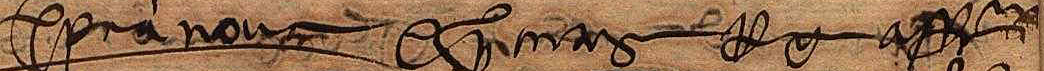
x̄paa noua e p̄o certeza Rogou a ffrco
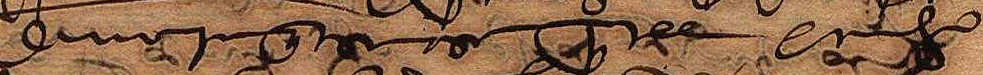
de moura q̄ asinase p̄o ell e eu djo
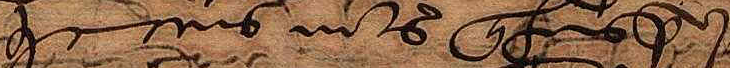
trauaços notro q̄ ho sp̄vj
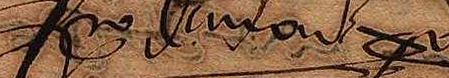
frco de moura
